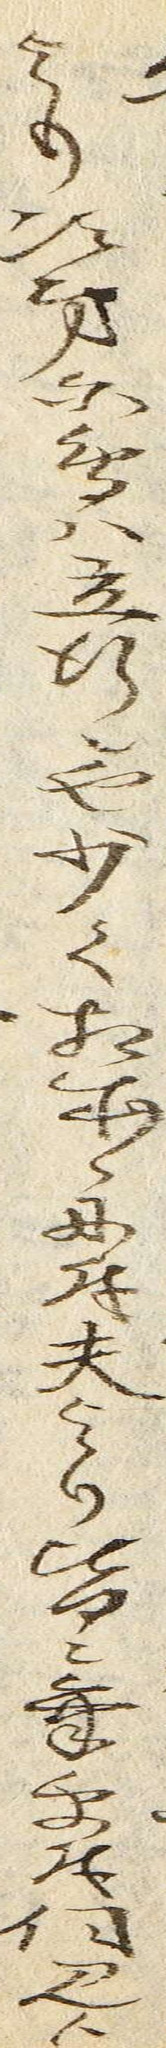より次第に鳥ハ立行候や少く相成候に付夫より皆々気を付伺見候
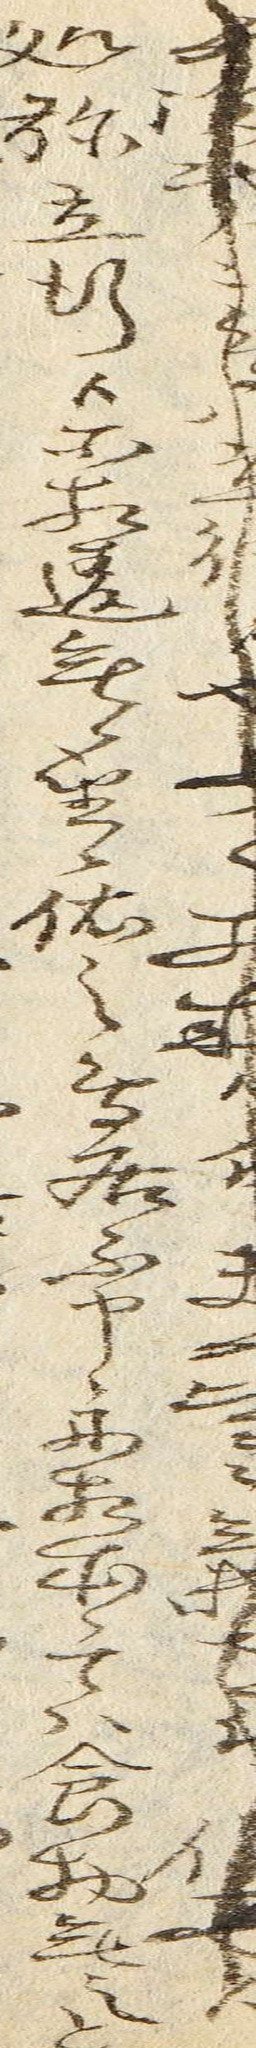処弥立行候に相違無御座候依之鳥居不申候に相成候てハ食物無之と
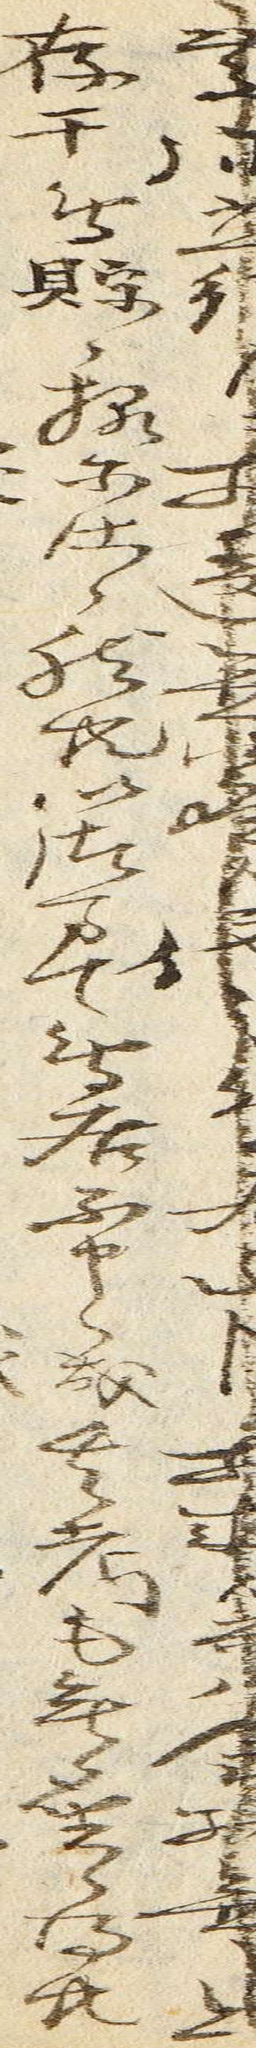存干鳥貯候様に仕候然共いつまて鳥居不申候哉其考も無御座候得共
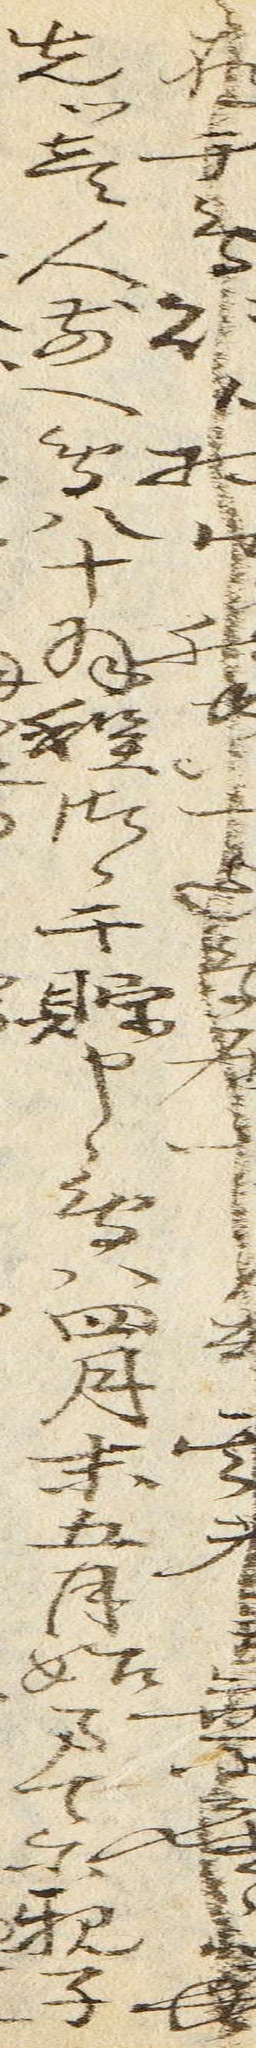先ツ壱人前へ鳥八十羽程つゝ干貯申候鳥ハ四月末五月始まてに親子
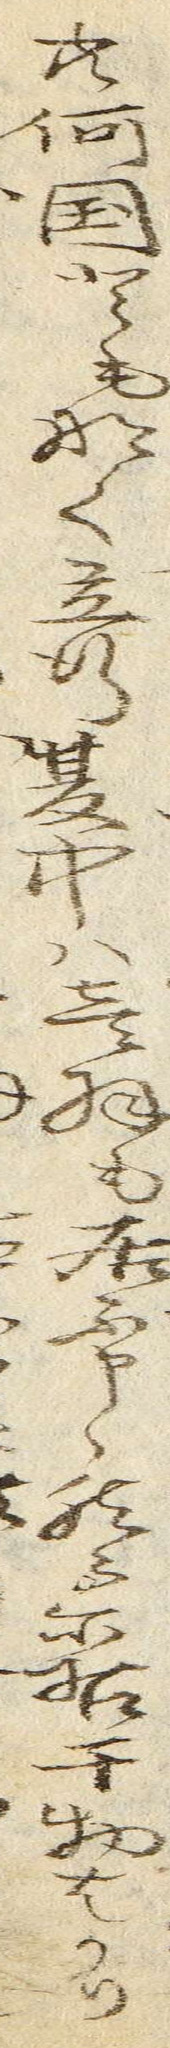共何国ともなく立行夏中ハ壱羽も居不申候然るに右干物はかり
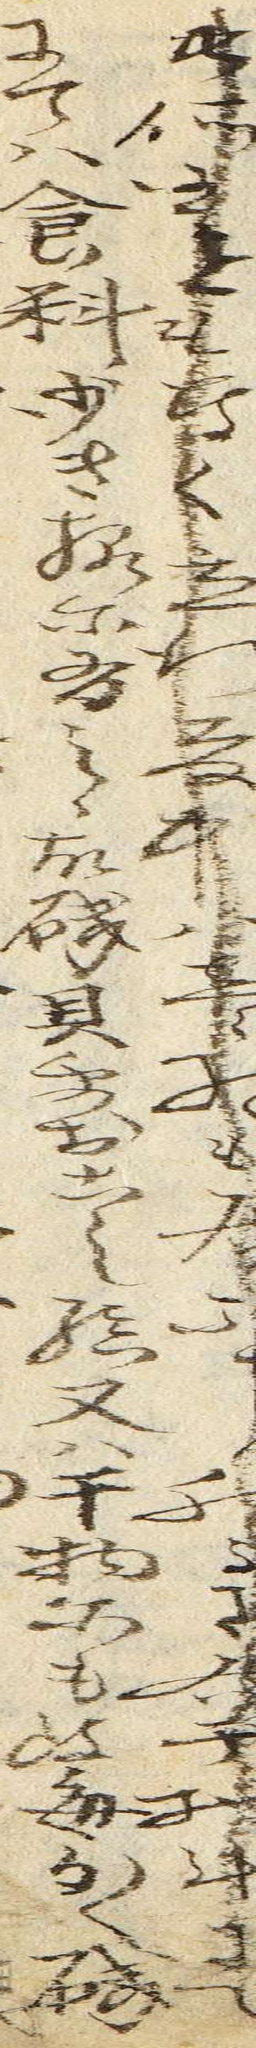にてハ食料少き様に有之候故礒貝をおこし給又ハ干物にも致毎日〳〵磯
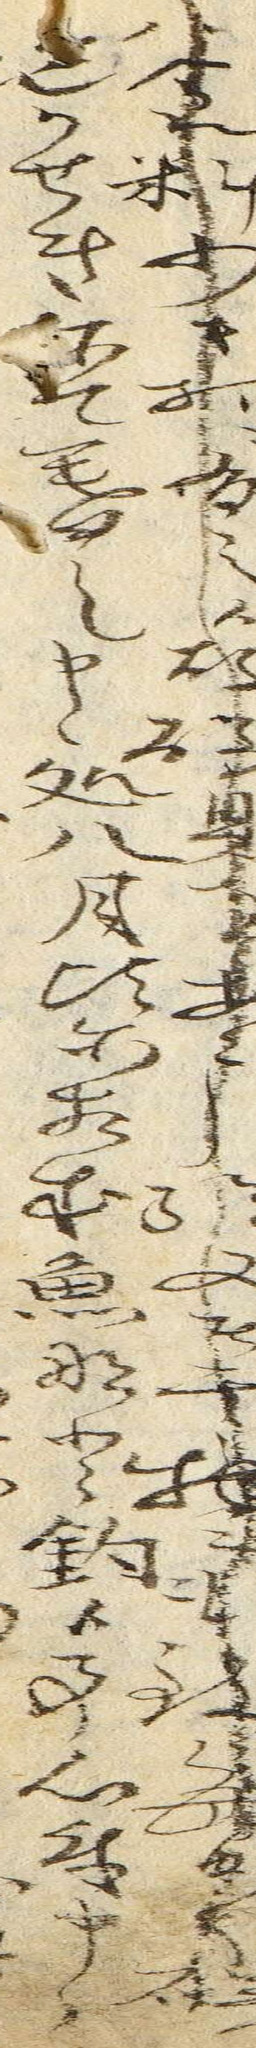辺かせきにて暮し申候処八月頃に相成魚なと釣候事心付申候

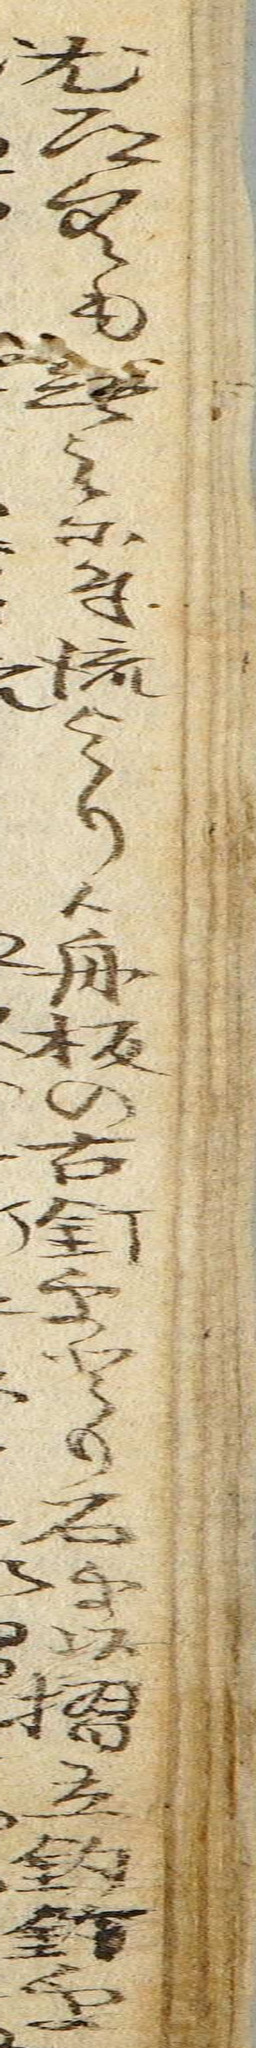尤道具も無之に付流より候舟板の古釘をとり石を以摺立釣釘を
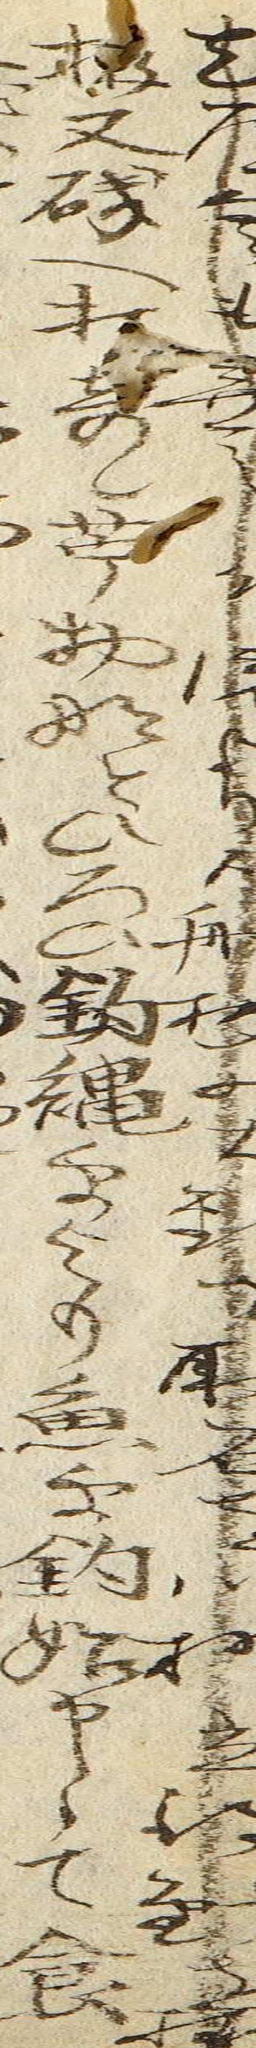拵又磯へ打寄候苧物なとひろひ釣縄をより魚を釣始申候て食
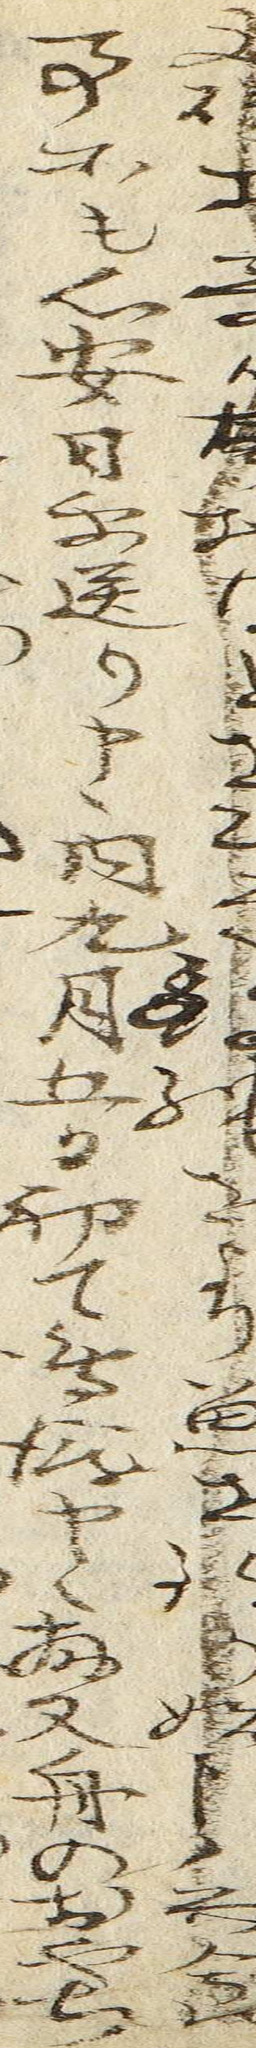事にも心安日を送り申候内九月五日初て鳥渡申候扨又舟のおやち
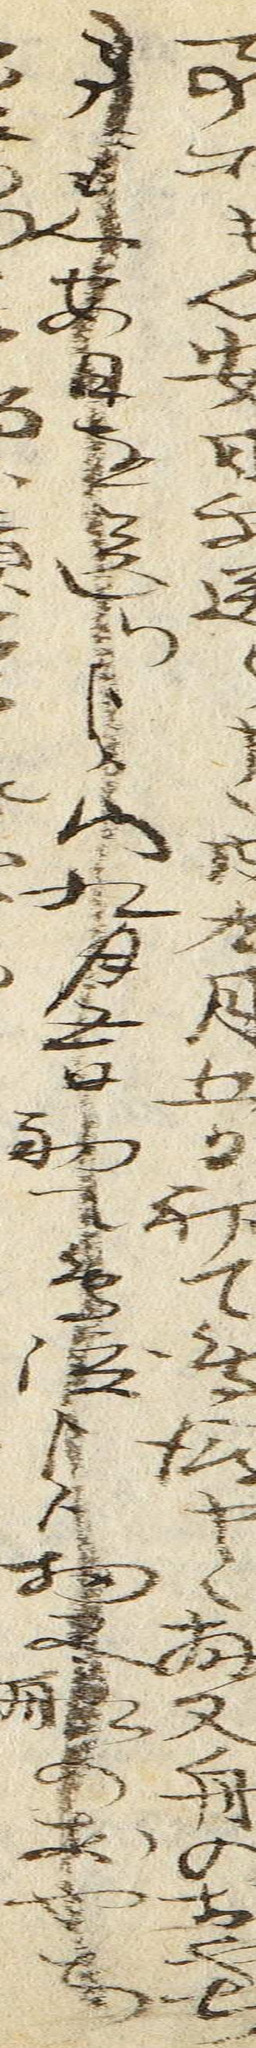事にも心安日を送り申候内九月五日初て鳥渡申候扨又舟のおやち
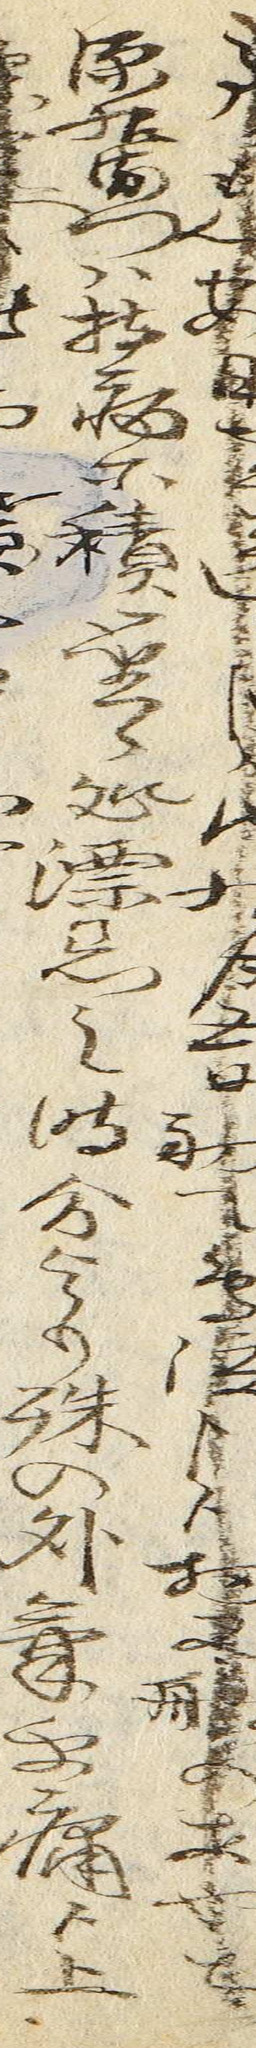源右衛門ハ持病に積御座候処漂着之時分より殊の外気を痛候上
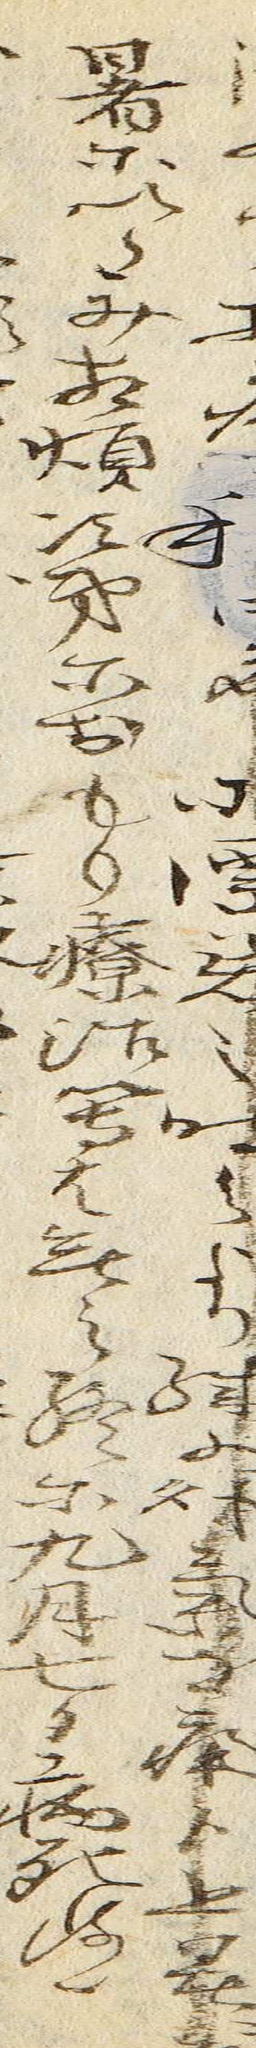暑にいたみ相煩次第におもり療治等は無之終に九月七日病死致候
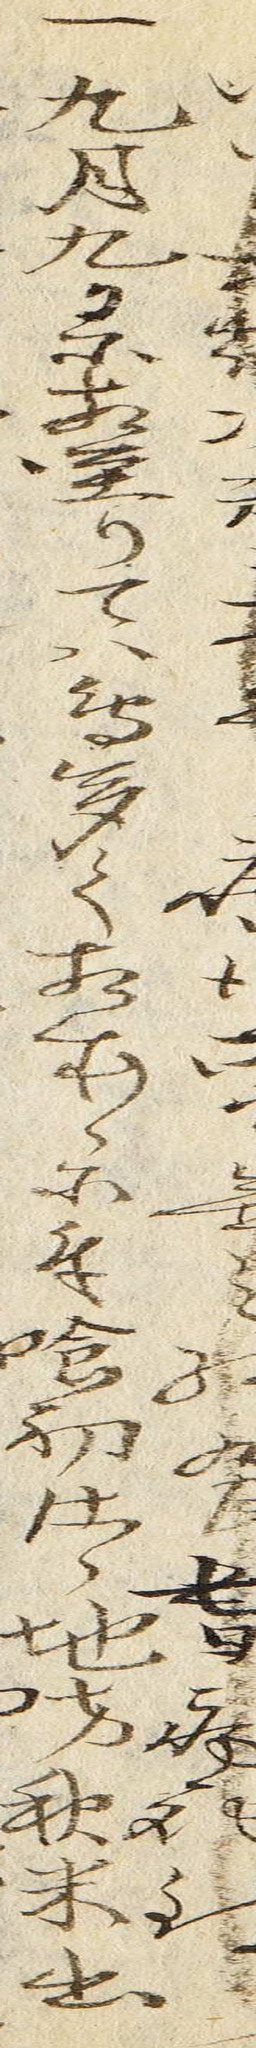一九月九日に相至りてハ鳥多く相成候に付喰初仕候地方秋米出
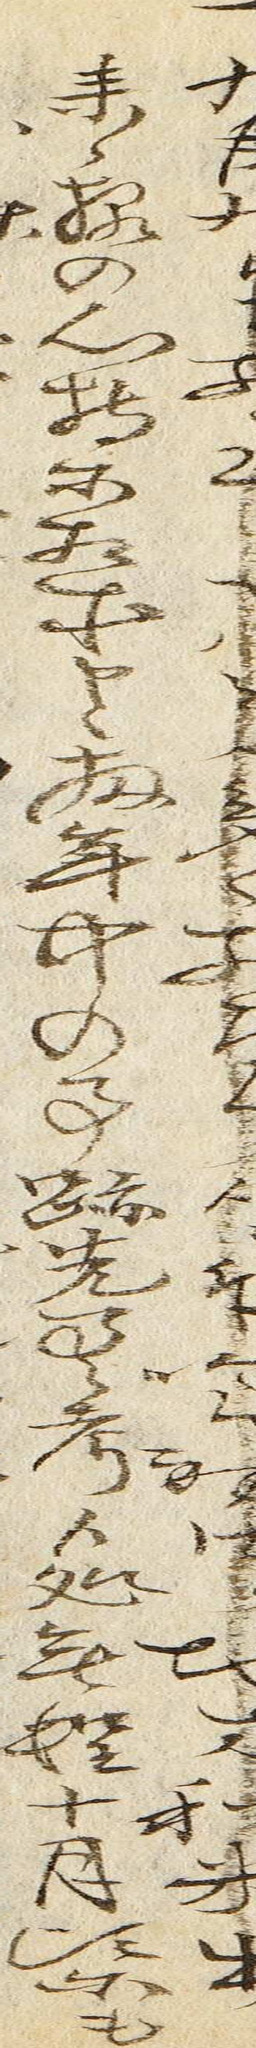来候様の心持に相成申候扨年中の事跡先差考候処無程十月頃にも
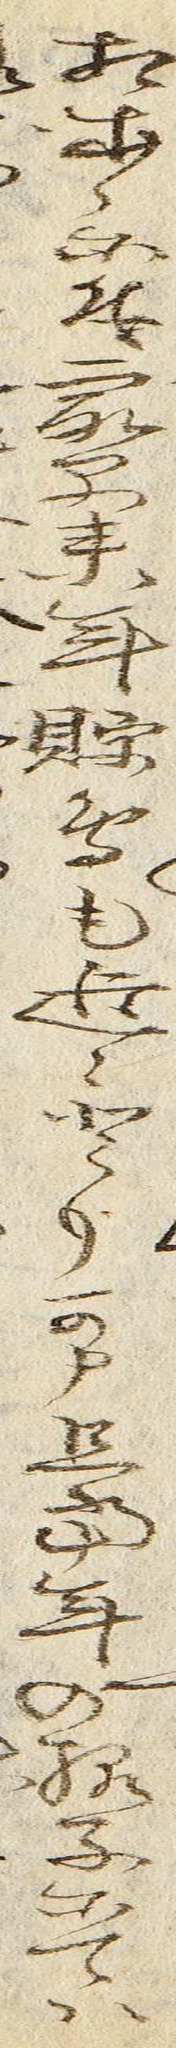相成候に付最早来年貯鳥も追々とり可申且当年の様子にてハ
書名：無人島漂流書付
